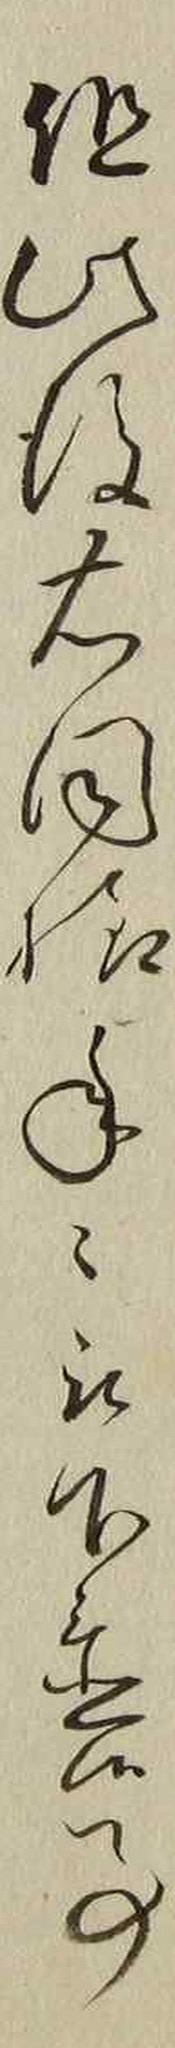但此後右同様年々被下置候事
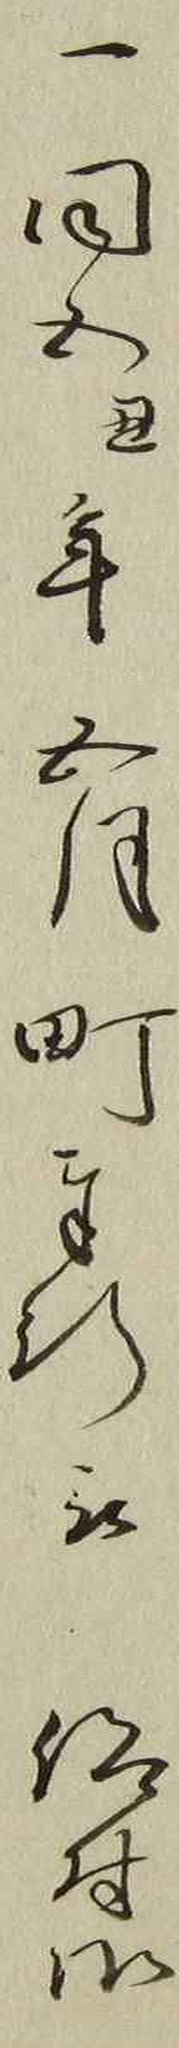一同五丑年五月町奉行被仰付御
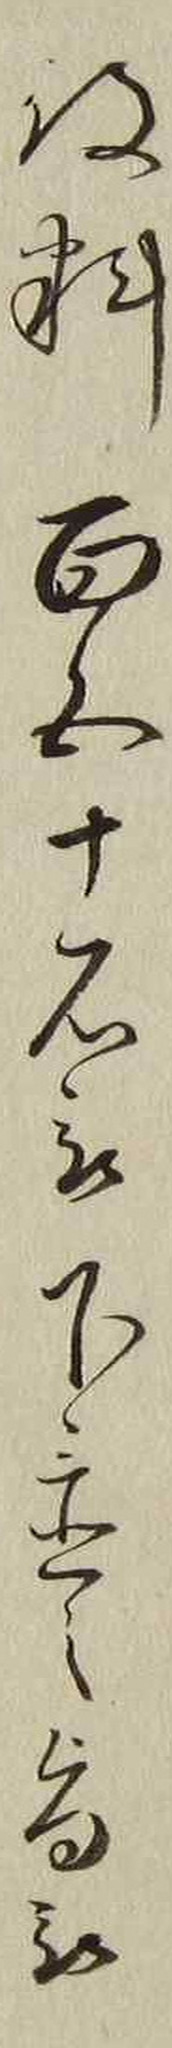役料百五十石被下置之旨被
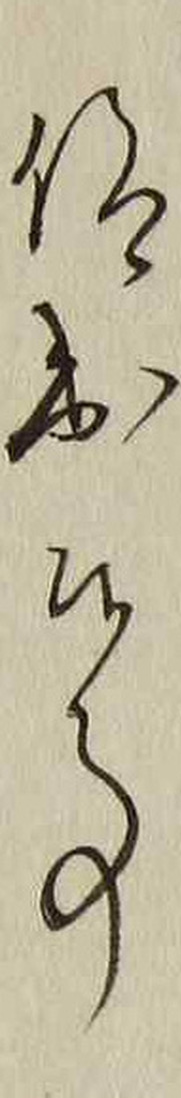仰出候事
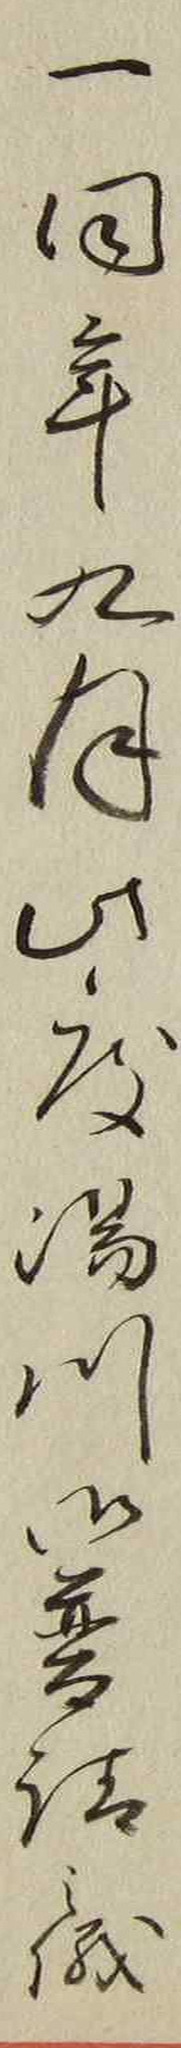一同年九月此度湯川御普請之儀
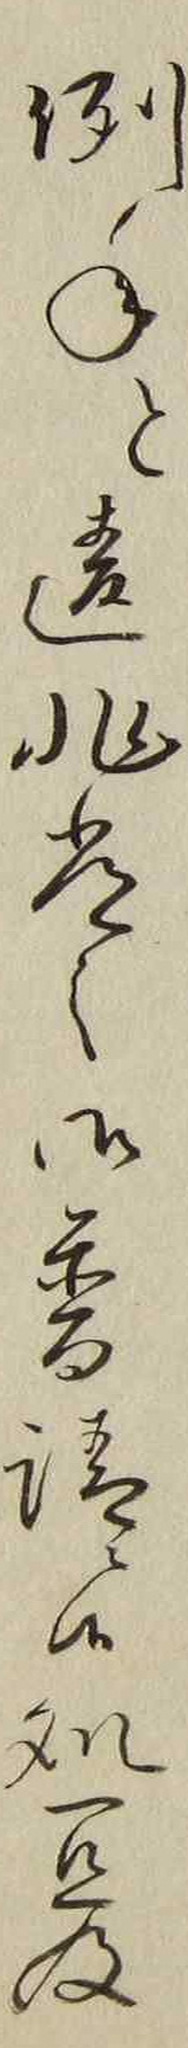例年と違非常之普請ニ候処宜及

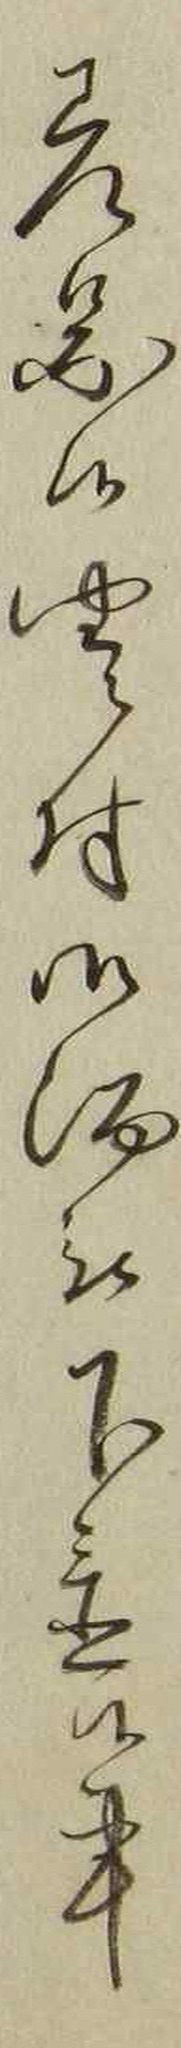差図候由ニ付御酒被下置候事
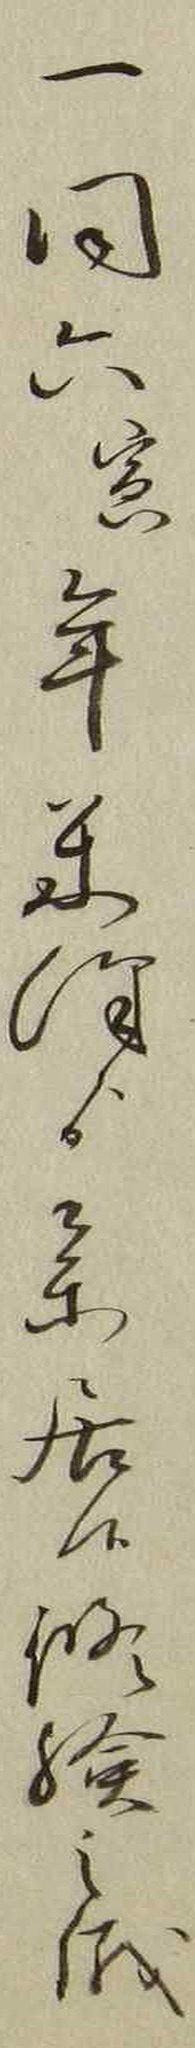一同六寅年米沢ゟ参居候修験之儀
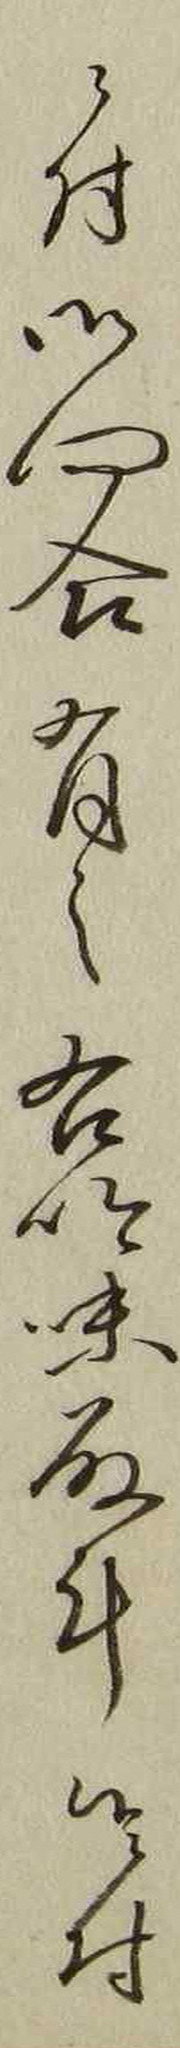ニ付御向合有之右吟味取計候ニ付
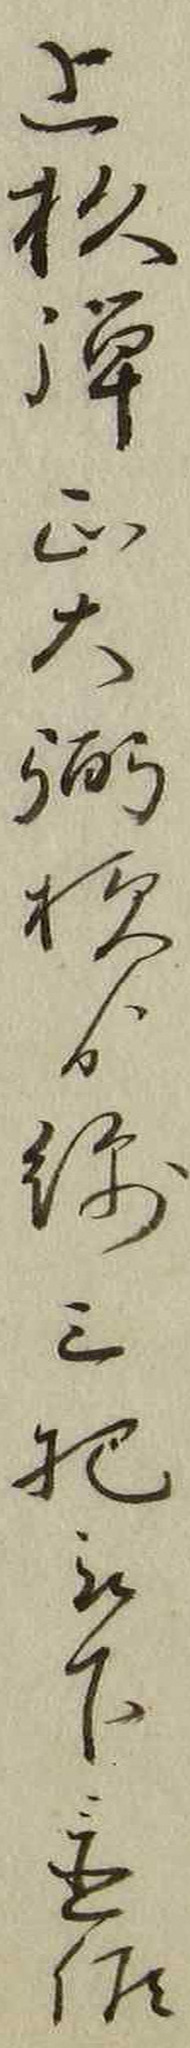上杉弾正大弼様ゟ綿三把被下置候
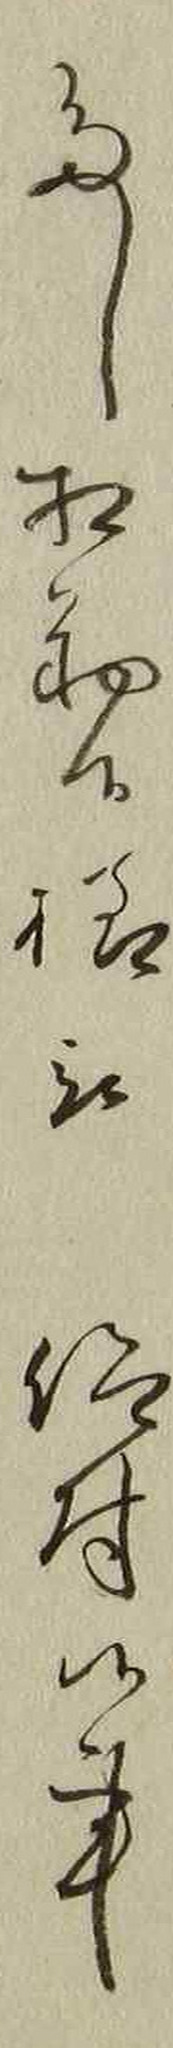たし相勤候様被仰付候事
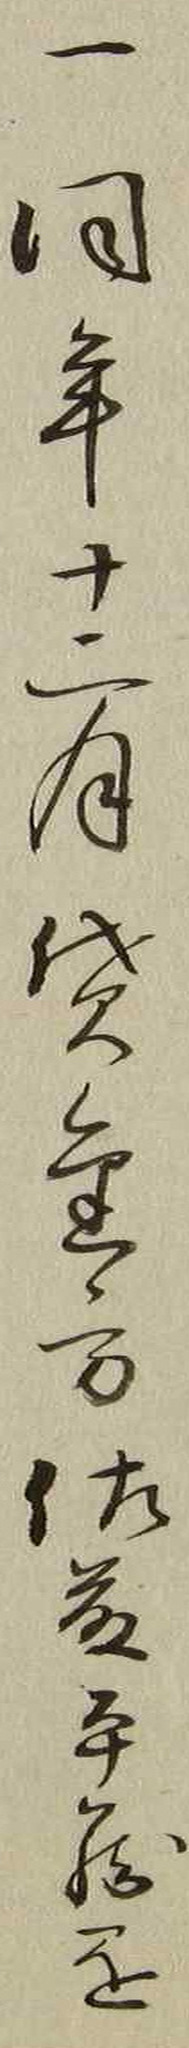一同年十二月貸金方佐藤平蔵懸
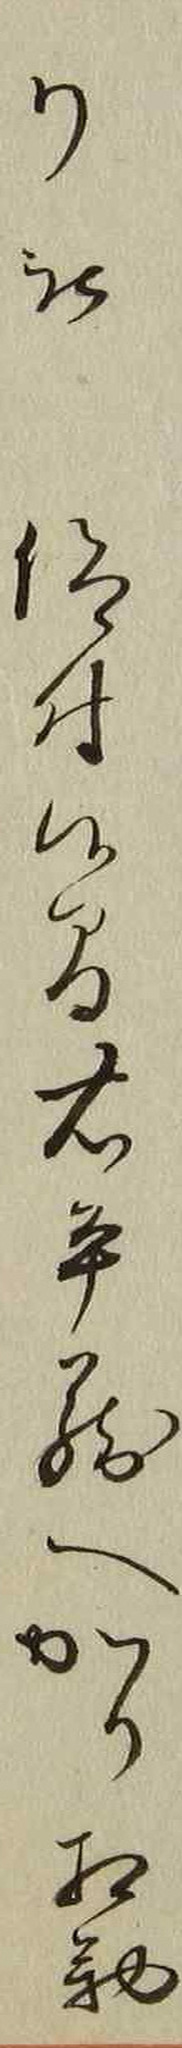り被仰付候間右平蔵へ加り相勤
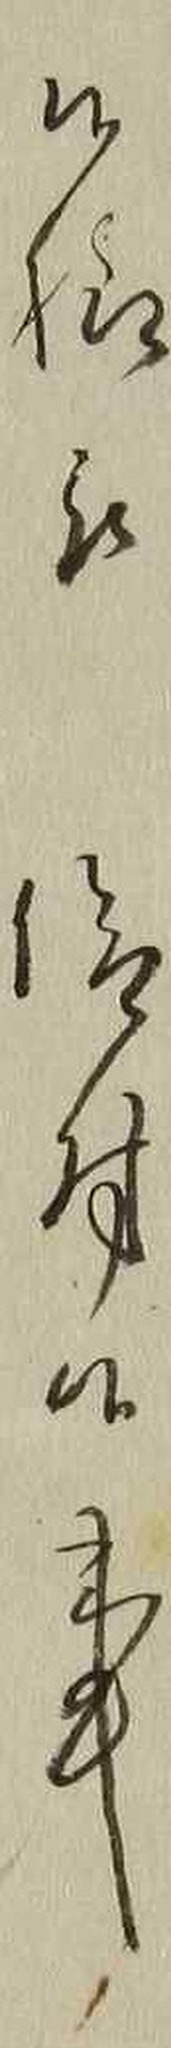候様被仰付候事
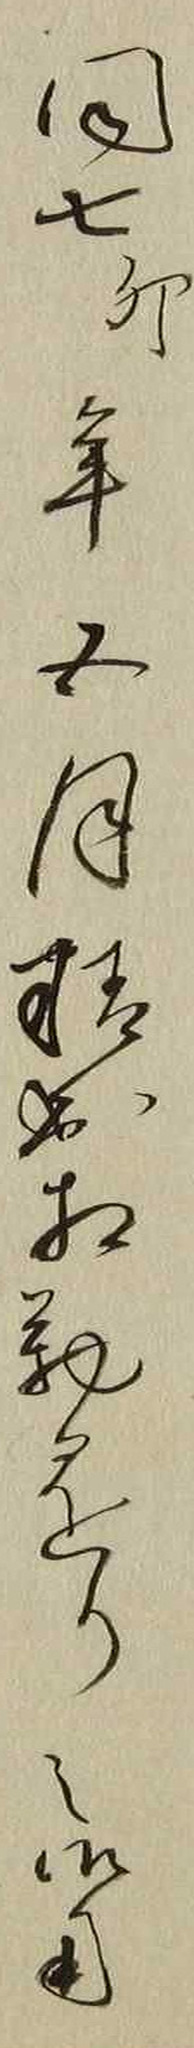同七卯年五月精出相勤懸り之御用
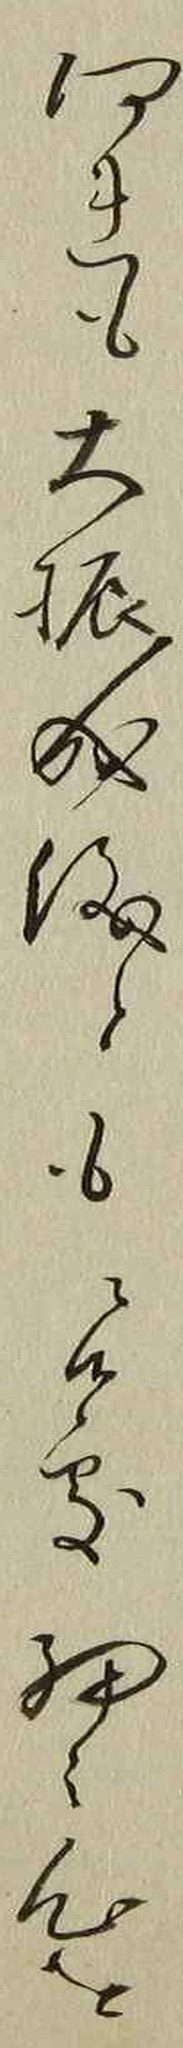何れも大振成儀ともに候処細々心を
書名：諸士系譜　巻之3　い之部3
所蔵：会津若松市立会津図書館
